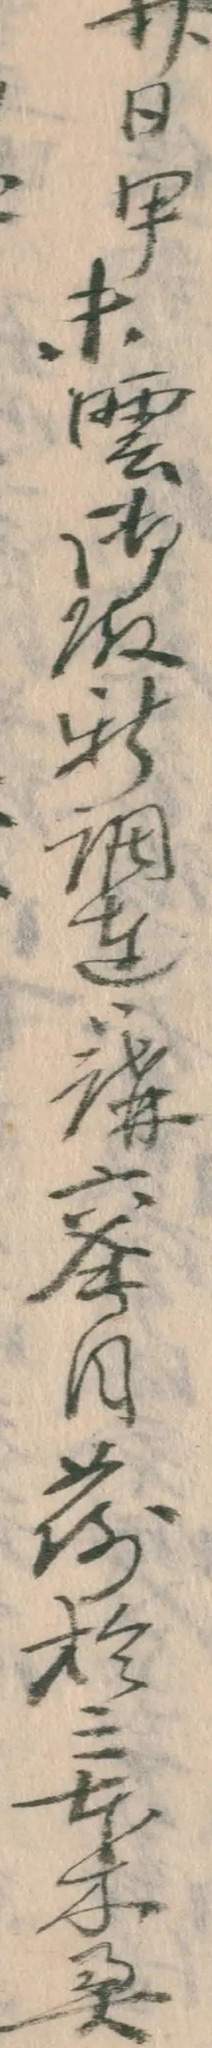廿日甲未曇御殿新調達御講六會目如例於三本木奥
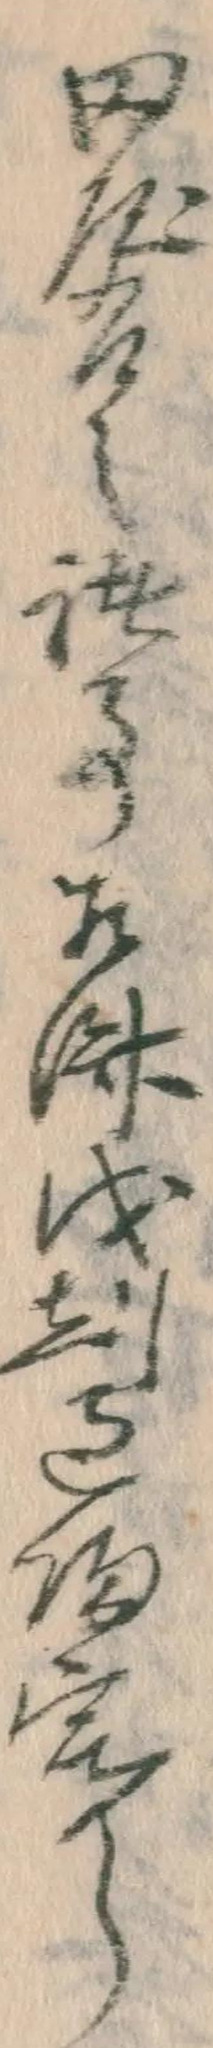田屋有之諸事相済戌刻過帰宅了
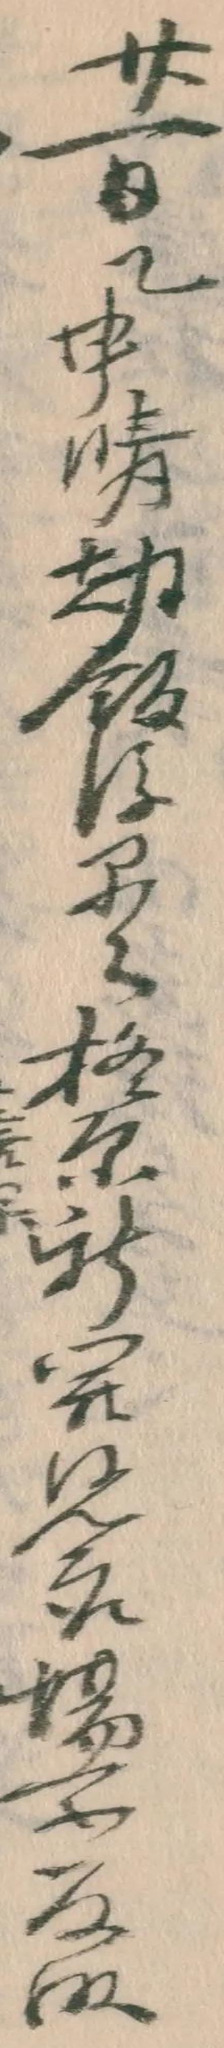廿一日乙申晴朝飯後早々柊原新開見取場所反畝
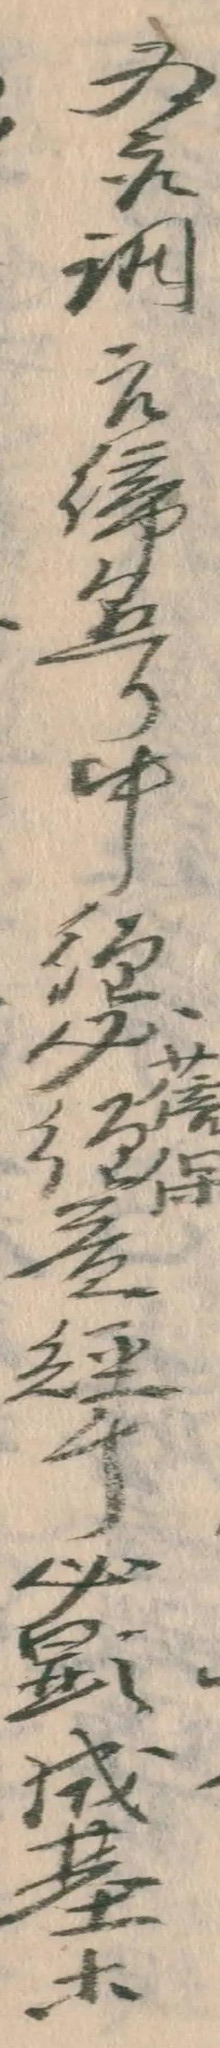為取調取締懸り中経必蓓保経益経千必顕成基等
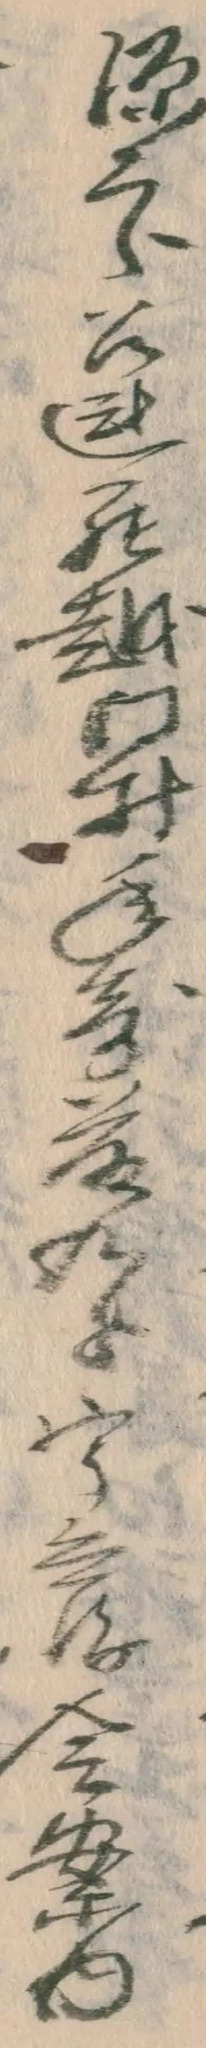源二郎召連罷越同村年寄藤九郎宇兵衛令案内
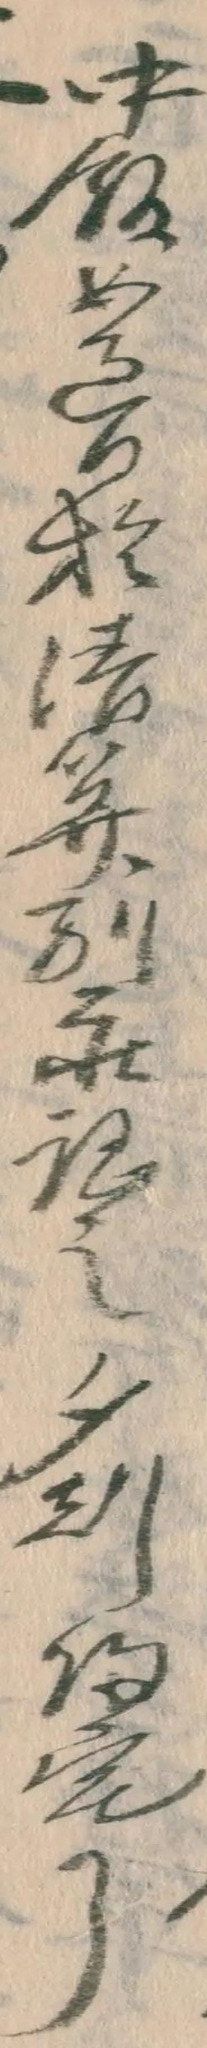中飯如過日於清算別条認之夕刻帰宅了
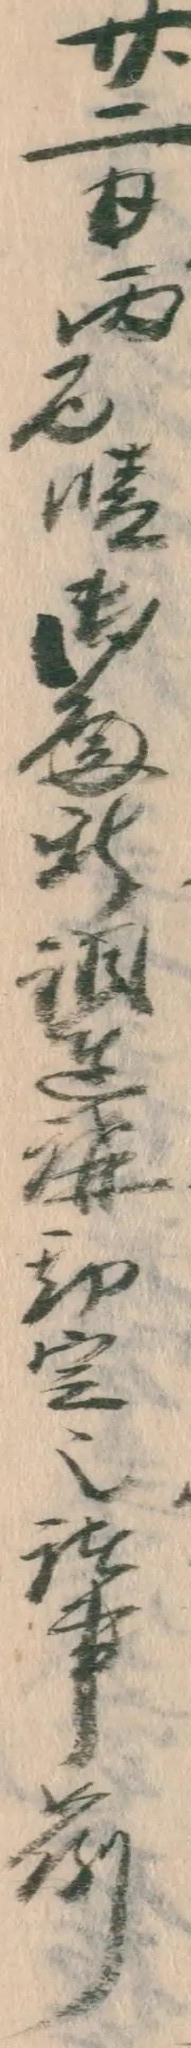廿二日丙酉晴御殿新調達講勘定之諸事如例
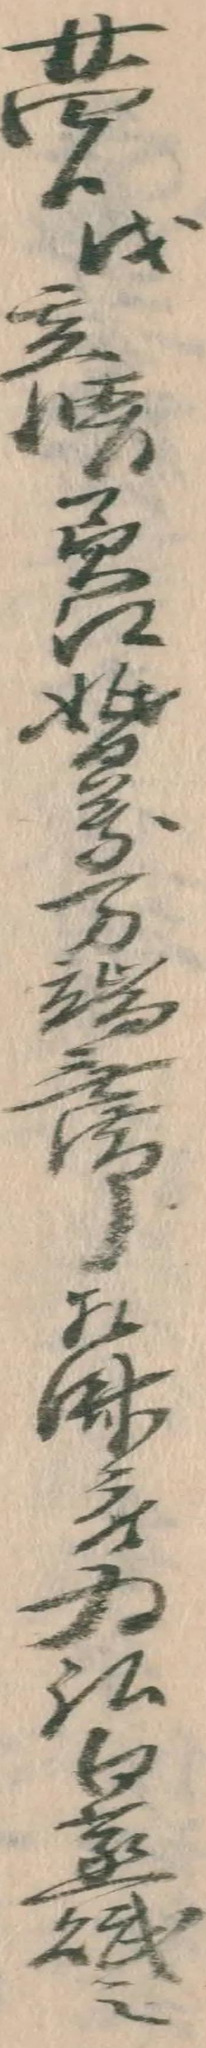廿四日戊亥晴美江婚義万端無滞相済ニ付為弘白蒸賦之
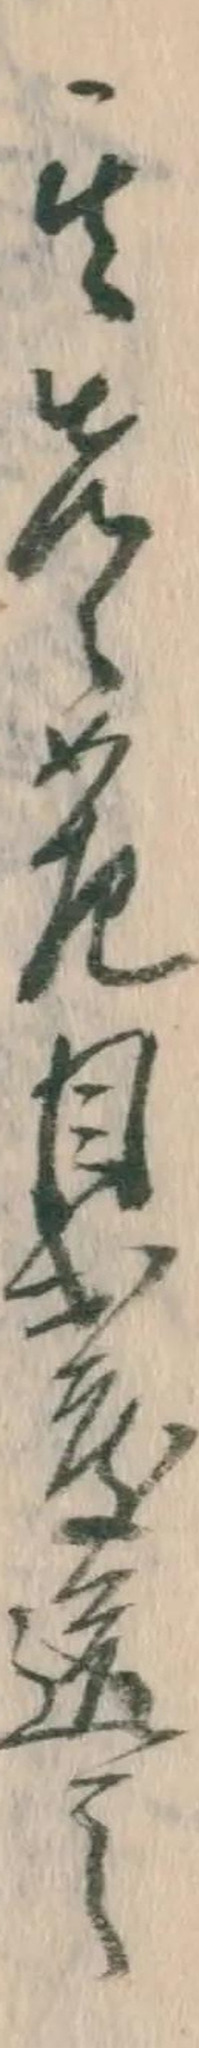其先〻如左目出度送之
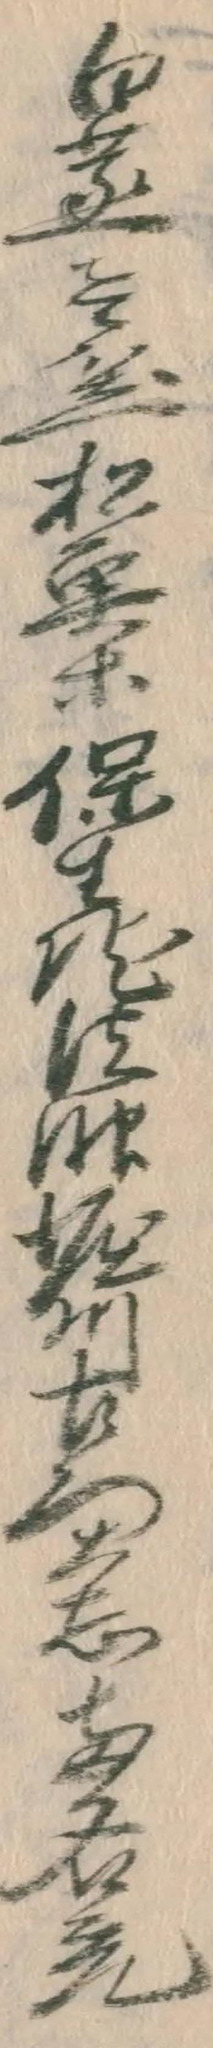白蒸壱器松魚等保生作法師堀川左衛門大志両名宛
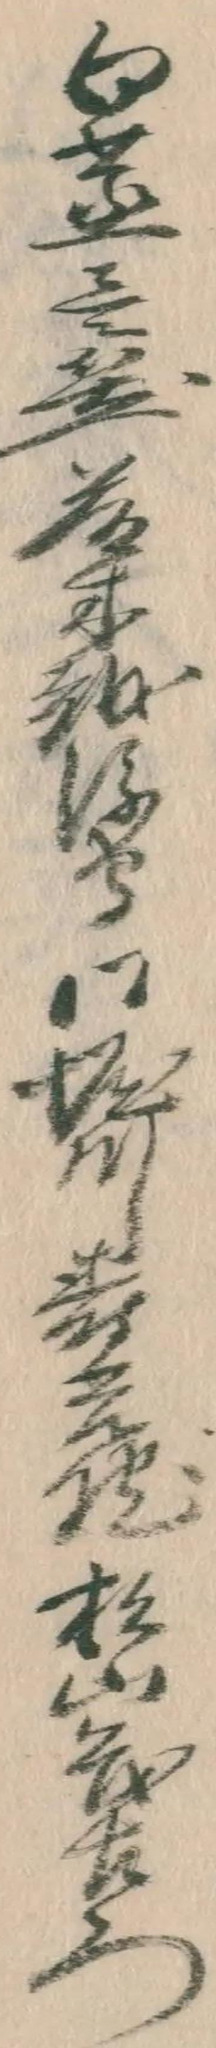白蒸壱器藤木越後守同堀川壽光院杉山茂左衛門
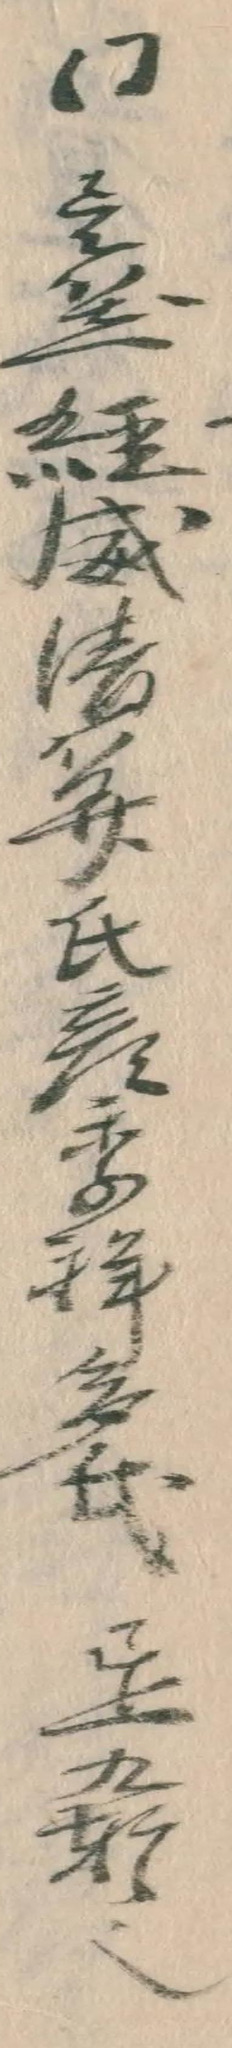同壱器経威清算氏彦季祥多氏已上九軒也
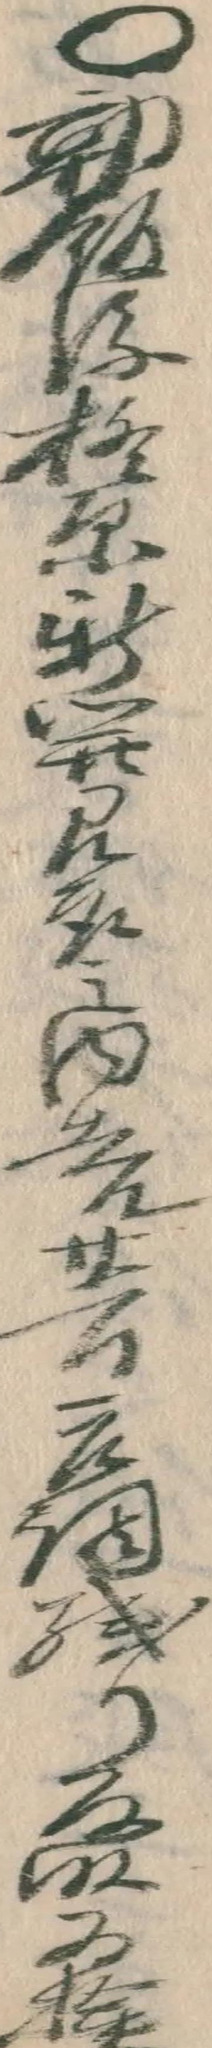○朝飯後柊原新開見取之内去ル廿一日取調残り反畝為検
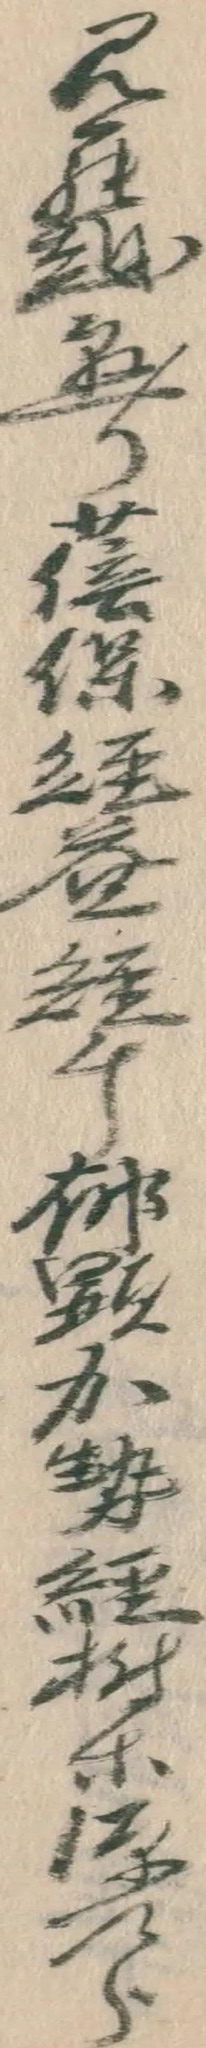見罷越懸り蓓保経益経千郁顕加勢経樹等源次郎
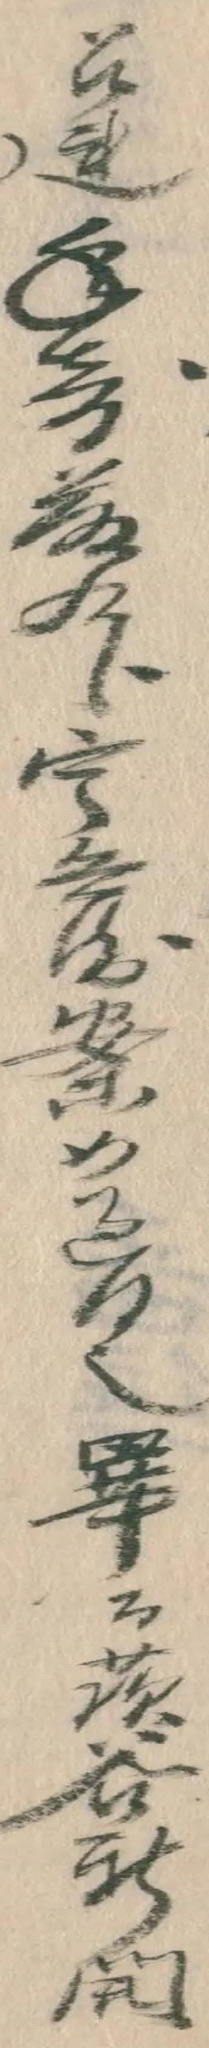召連年寄藤九郎宇兵衛案如過日之畢而茨谷新開
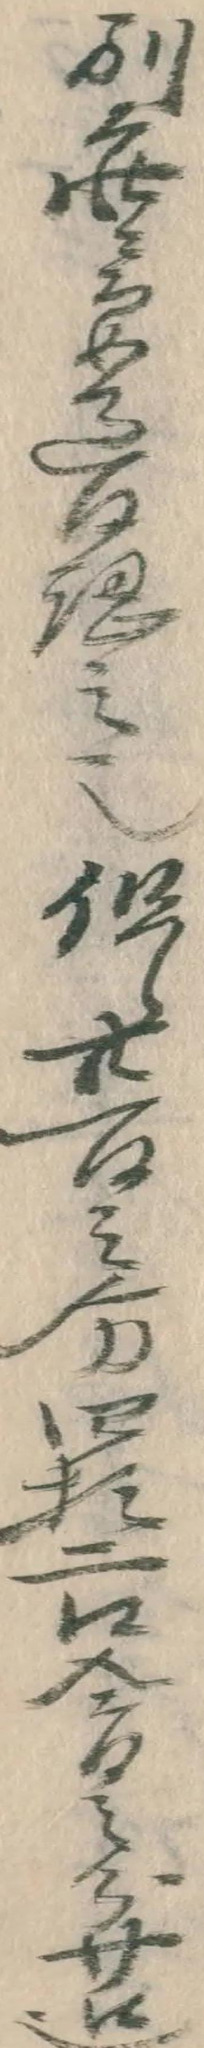別条ニ而如過日認之也但し廿百之分四拾二口合之分廿迄
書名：賀茂社記録. 第67冊
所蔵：国立国会図書館 National Diet Library, JAPAN
